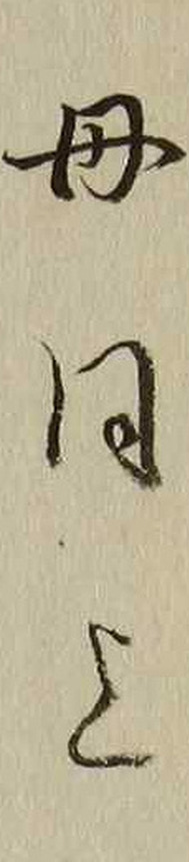母同上
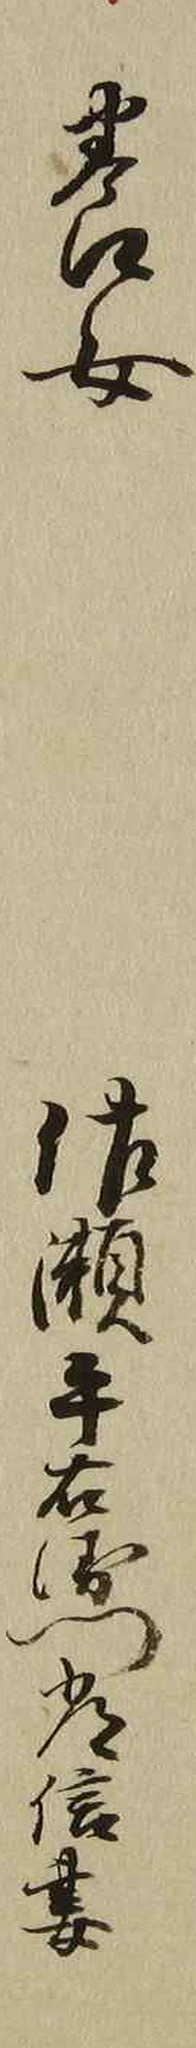養女佐瀬平右衛門常信妻
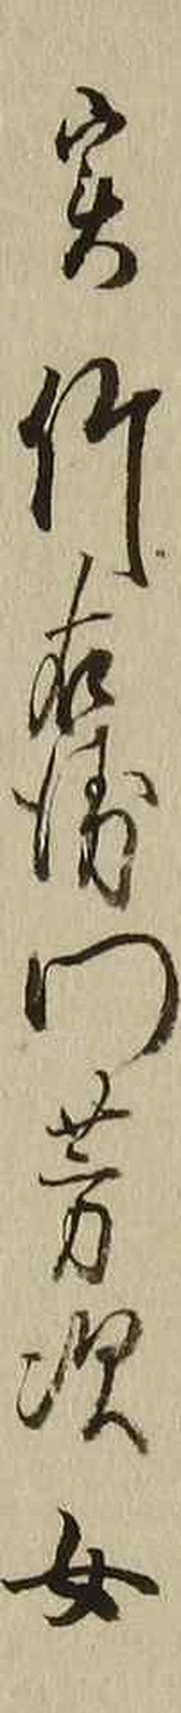実竹右衛門芳次女
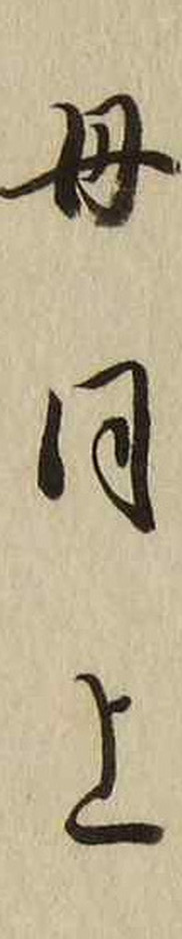母同上

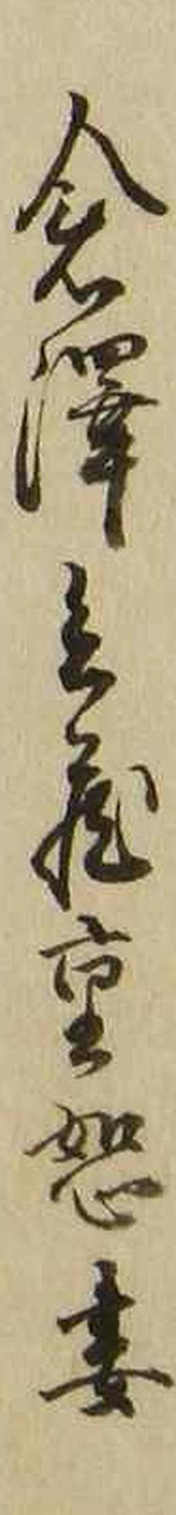女金澤兵蔵重恕妻
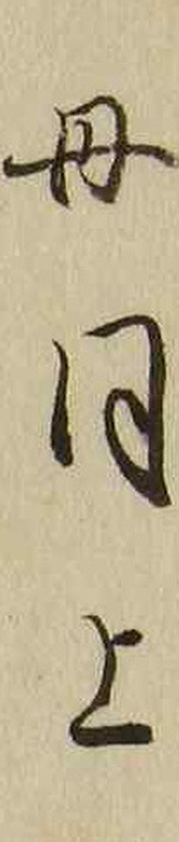母同上
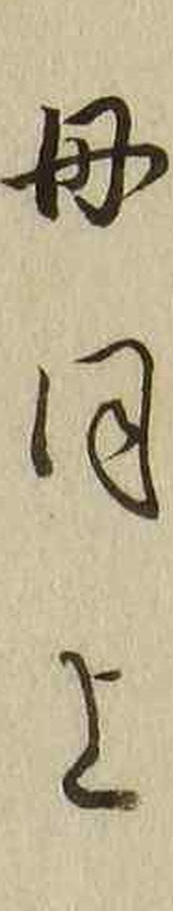母同上
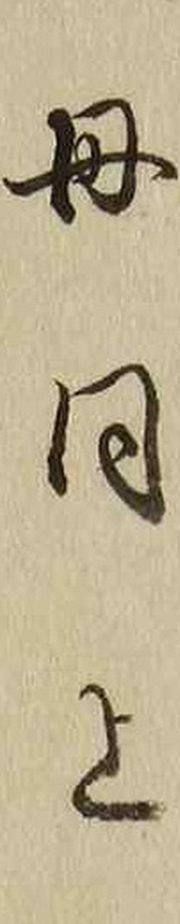母同上
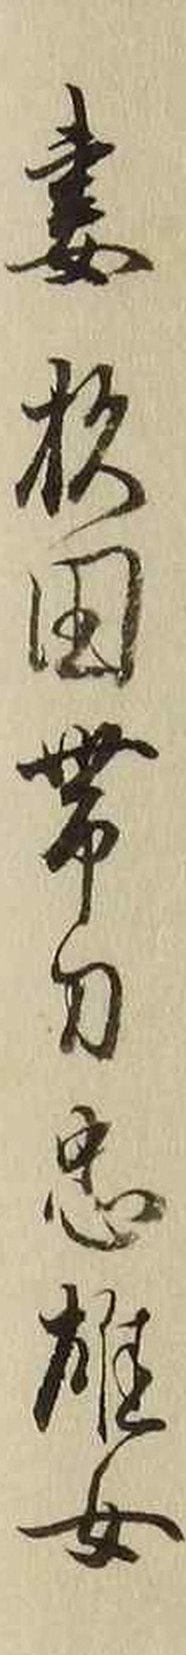妻杉田帯刀忠雄女
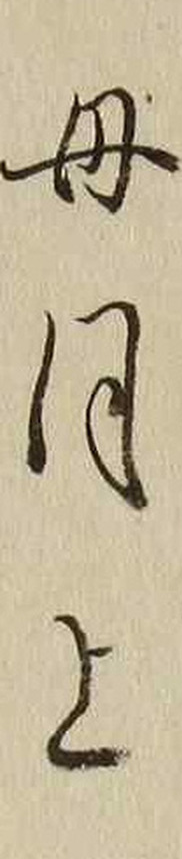母同上

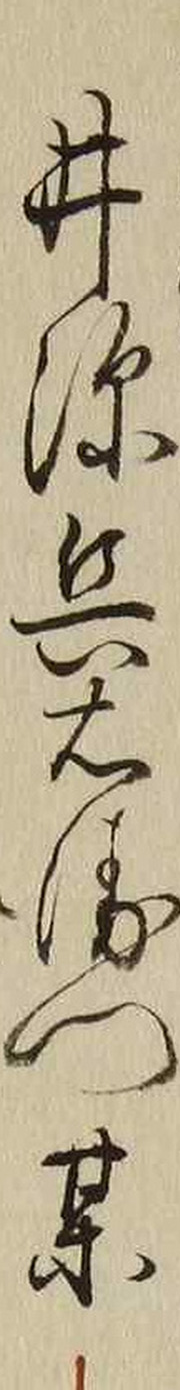井深兵右衛門某
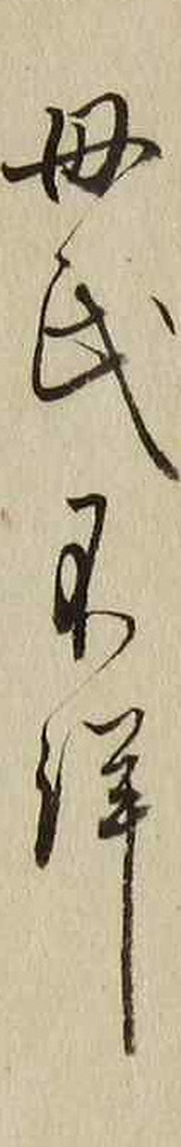母氏不詳
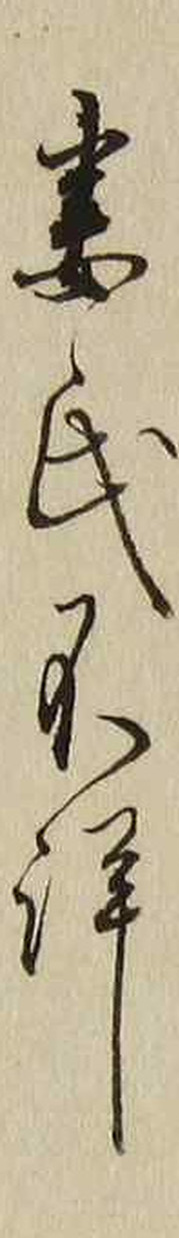妻氏不詳
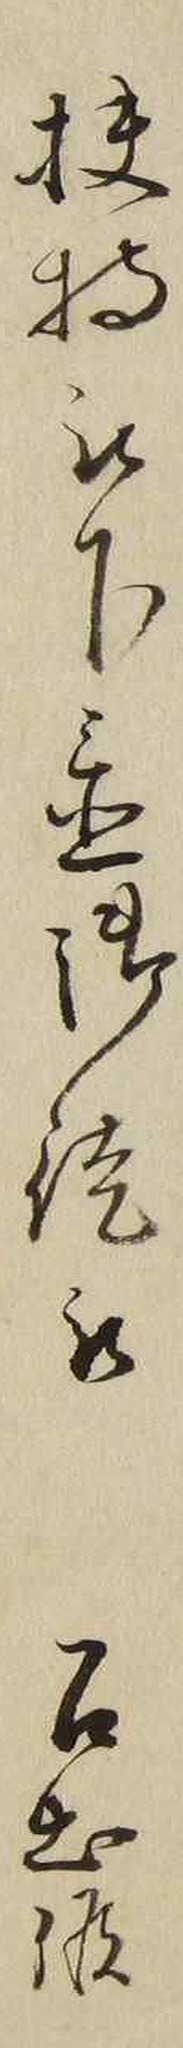扶持被下置御徒被召出候

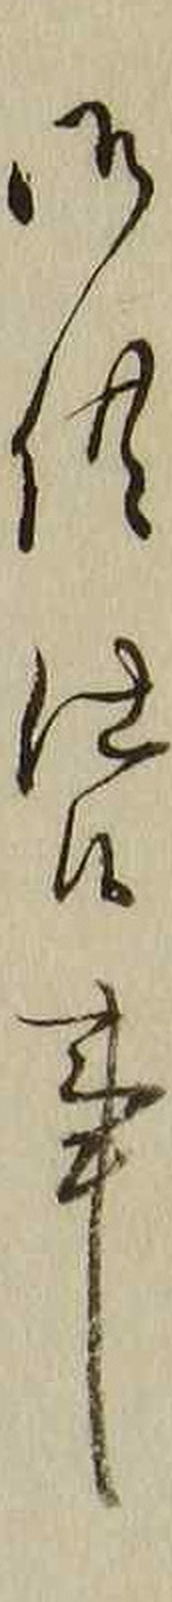御供仕候事
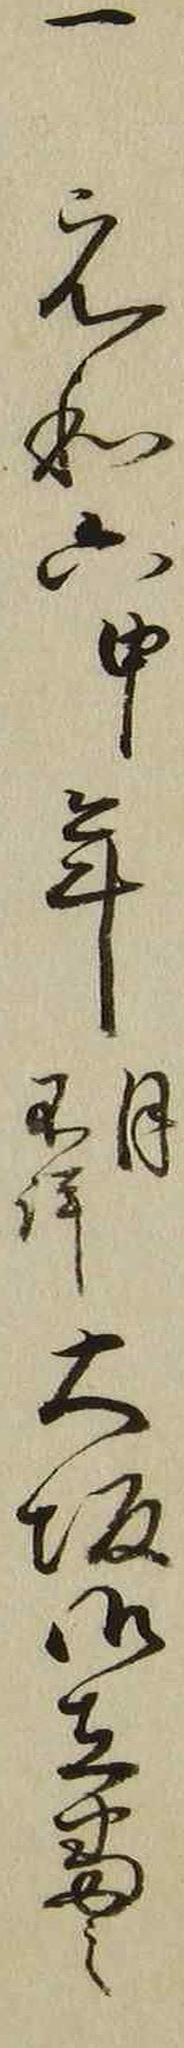一元和六申年月不詳大坂御在番の
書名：諸士系譜　巻之1　い之部1
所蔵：会津若松市立会津図書館
